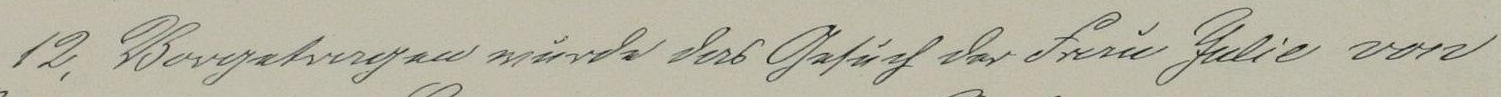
12. Vorgetragen wurde das Gesuch der Frau Julie von
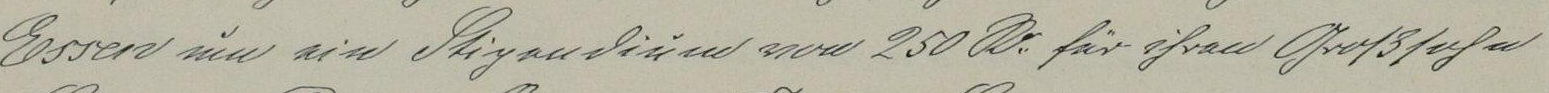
Essen um ein Stipendium von 250 Ro. für ihren Großsohn
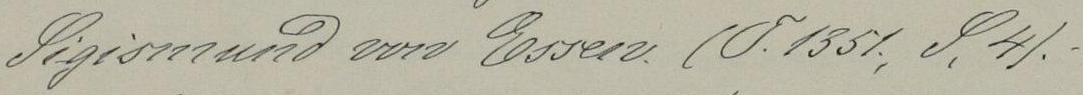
Sigismund von Essen. (T.1351; S.4).
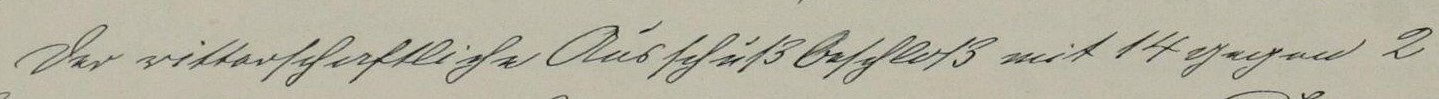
Der ritterschaftliche Ausschuß beschloß mit 14 gegen 2
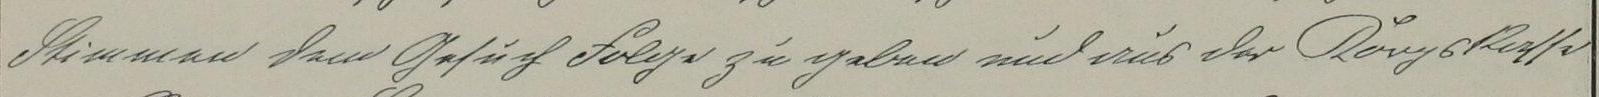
Stimmen dem Gesuch Folge zu geben und aus der Korpskasse
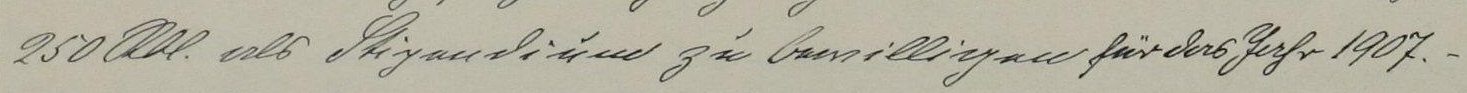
250 Rbl. als Stipendium zu bewilligen für das Jahr 1907.
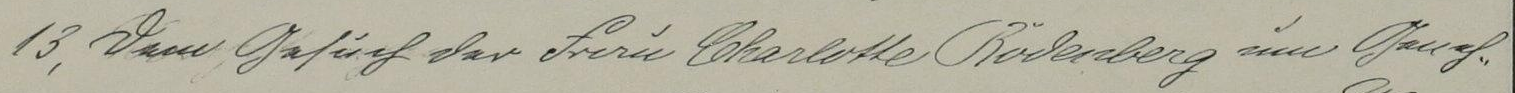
13. Dem Gesuch der Frau Charlotte Rodenberg um Geneh-
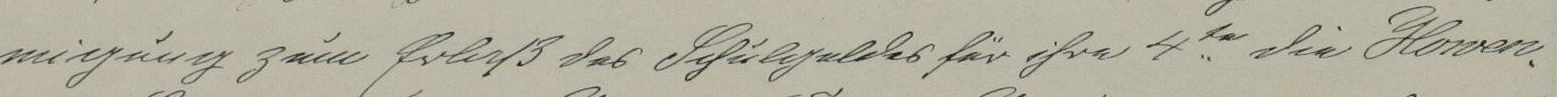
migung zum Erlaß des Schulgeldes für ihre 4te, die Howen-
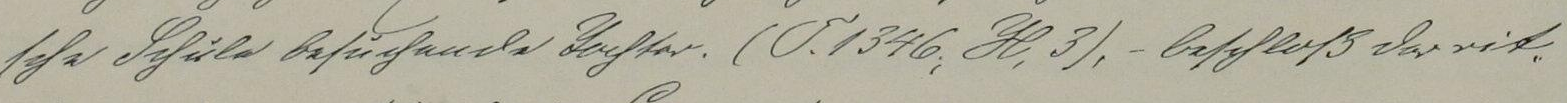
sche Schule besuchende Tochter (T.1346; H.3), beschloß der rit-
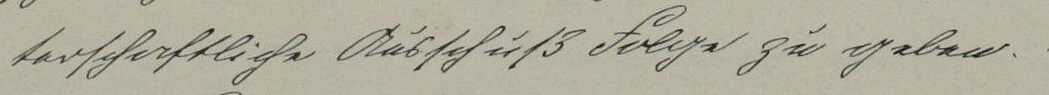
terschaftliche Ausschuß Folge zu geben.
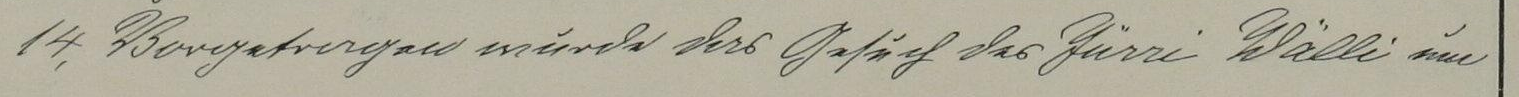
14. Vorgetragen wurde das Gesuch des Jürri Wälli um
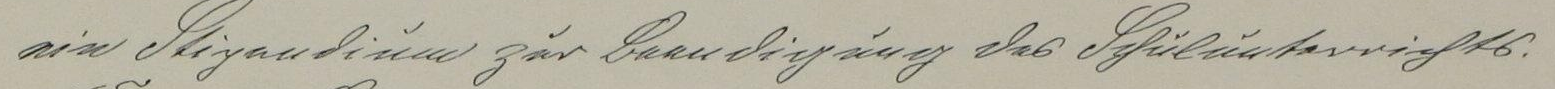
ein Stipendium zur Beendigung des Schulunterrichts
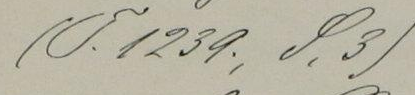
(T.1239; S.3).
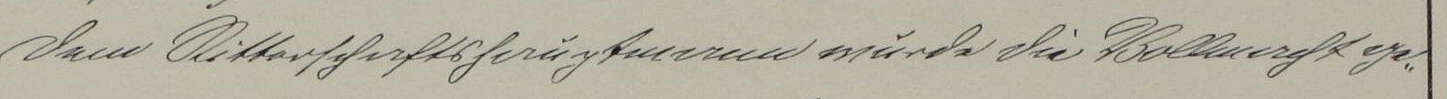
Dem Ritterschaftshauptmann wurde die Vollmacht ge-
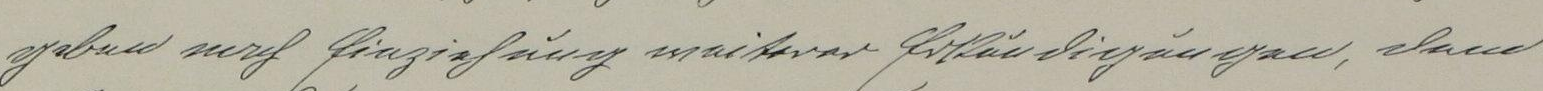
geben nach Einziehung weiterer Erkundigungen, dem
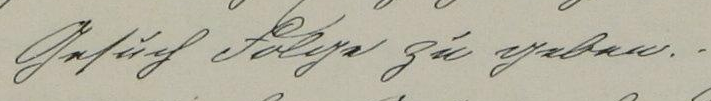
Gesuch Folge zu geben.
